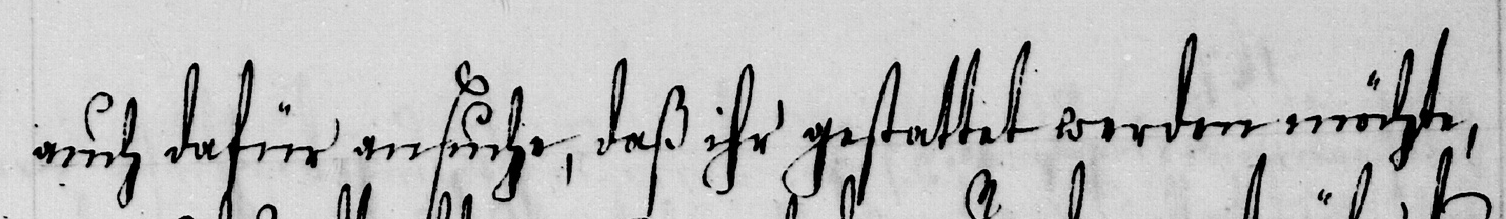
auch dafür ansuche, daß ihr gestattet werden möchte,
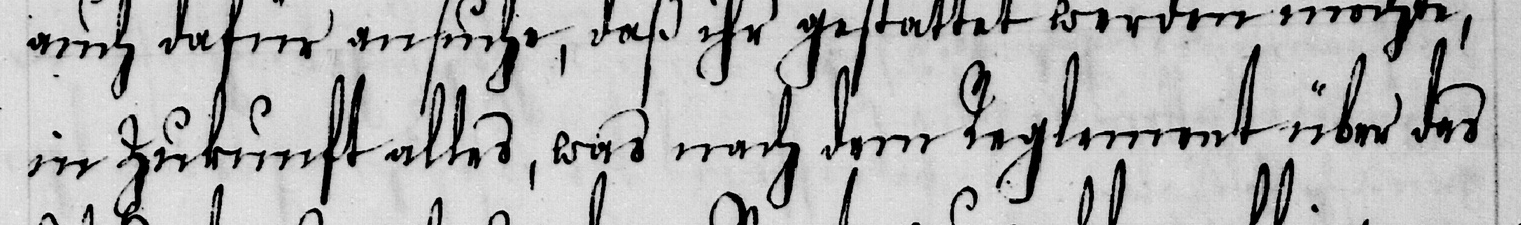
in Zukunft alles, was nach dem Reglement über das
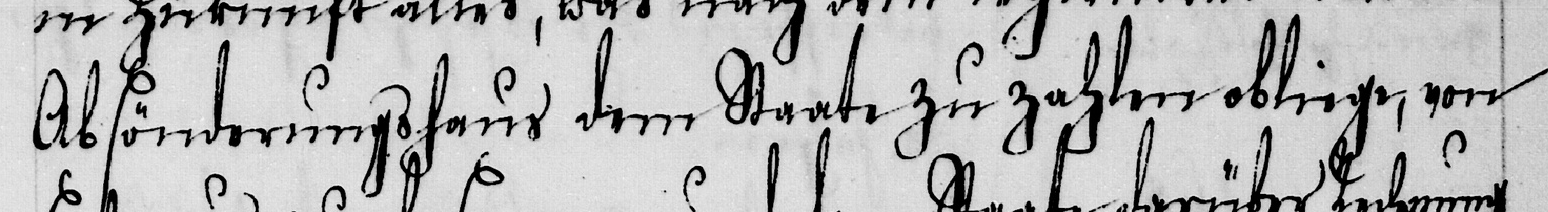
Absönderungshaus dem Staate zu zahlen obliege, von
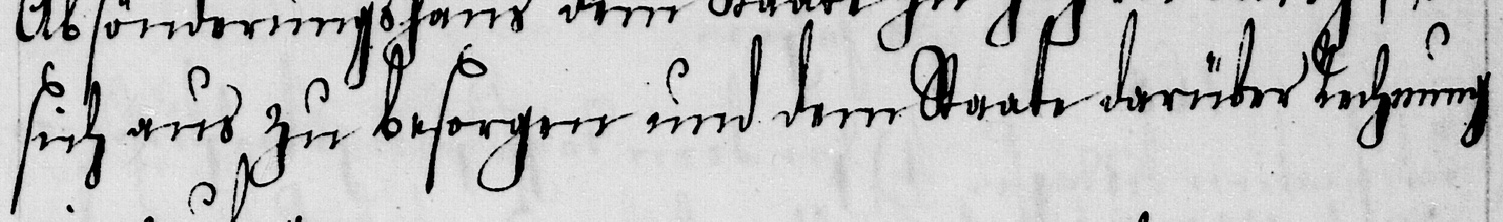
sich aus besorgen und dem Staate darüber Rechnung
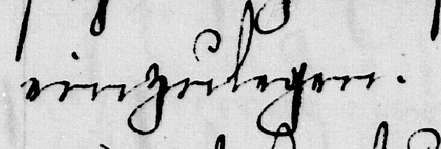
einzulegen.
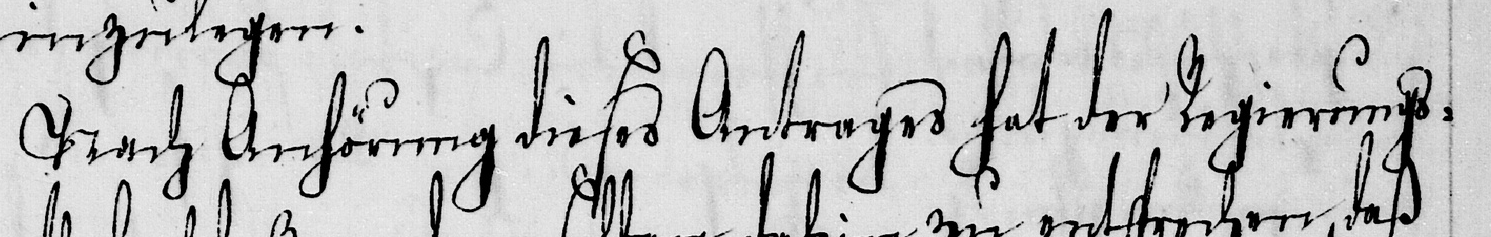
Nach Anhörung dieses Antrages hat der Regierungs¬
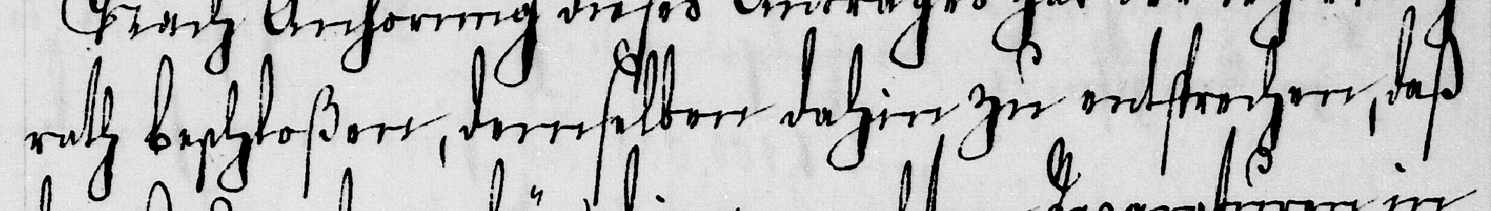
rath beschloßen, demselben dahin zu entsprechen, daß
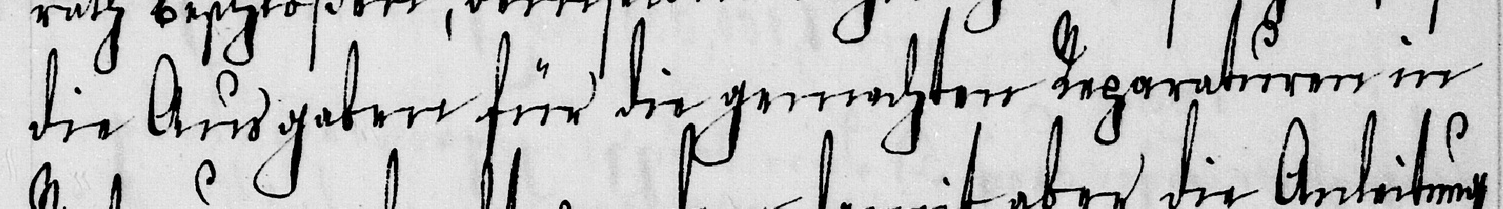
die Ausgaben für die gemachten Reparaturen in
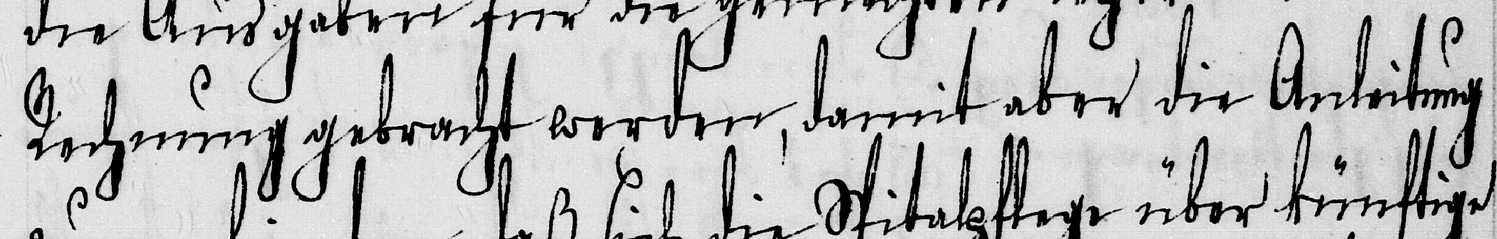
Rechnung gebracht werden, damit aber die Anleitung
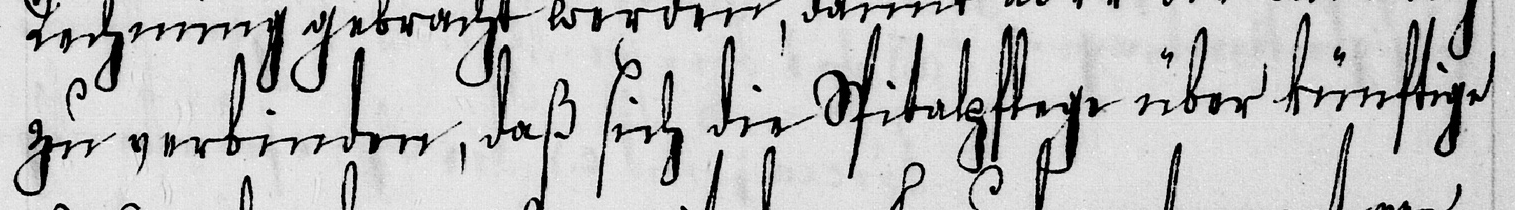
zu verbinden, daß sich die Spitalpflege über künftige
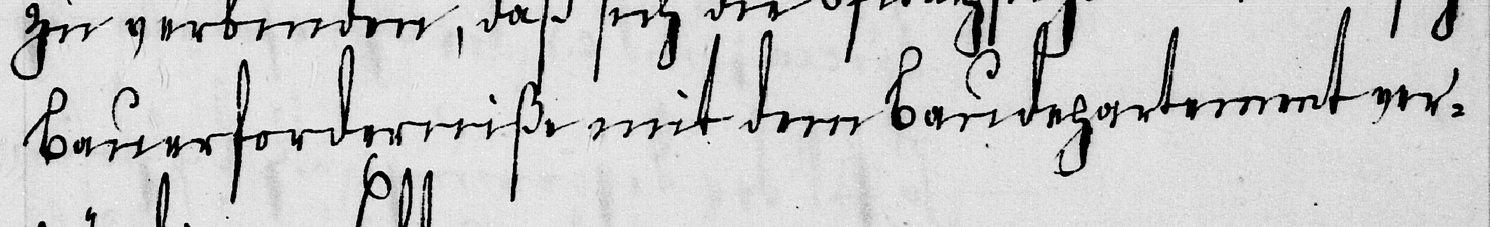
Bauerforderniße mit dem Baudepartement ver¬
